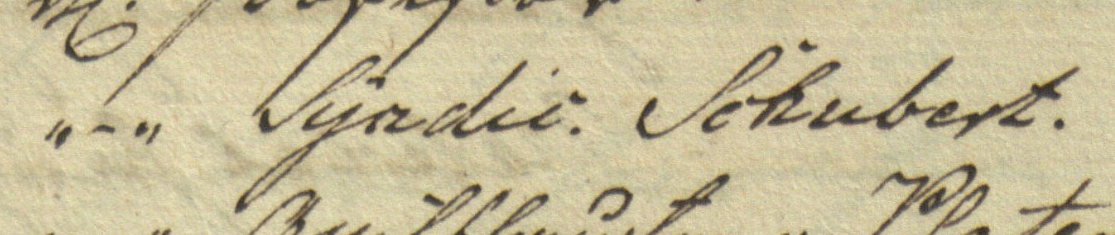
Sÿndic. Schubert.
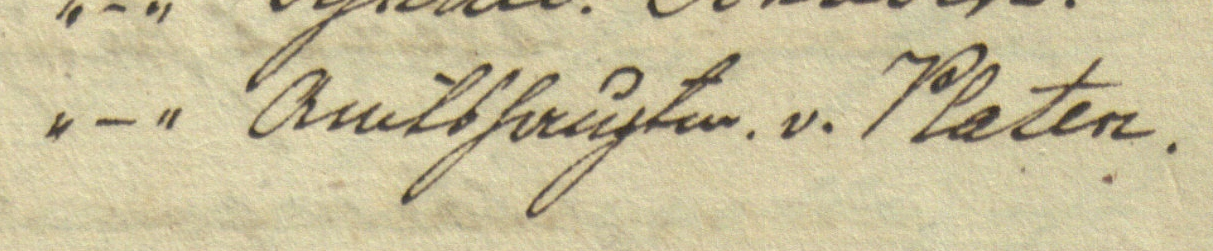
Amtshauptm. v. Platen.
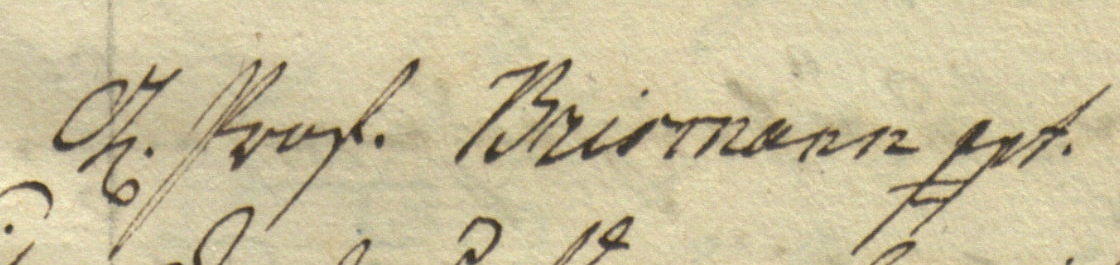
dh. Prof. Brismann ppt.
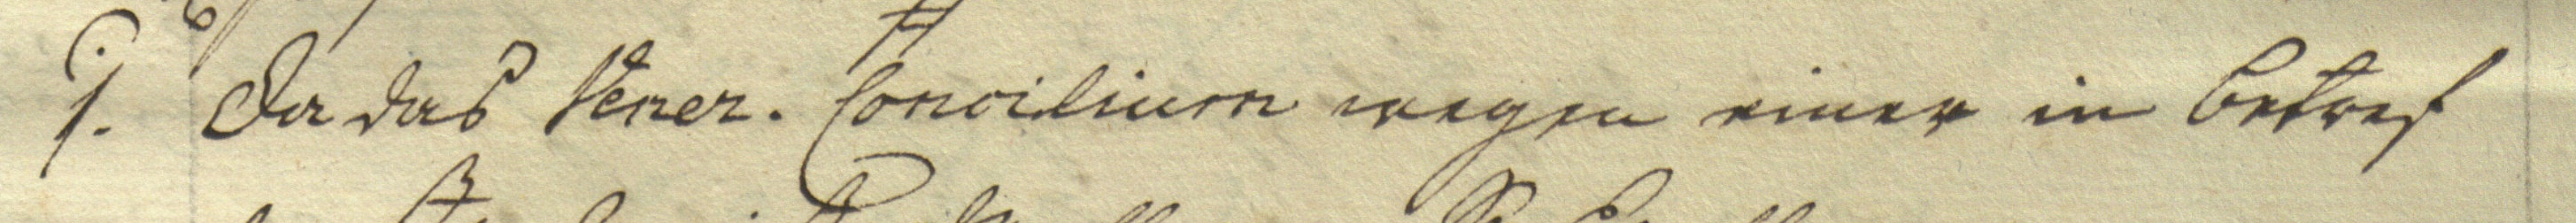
1. Da das Vener. Concilium wegen einer in Betref
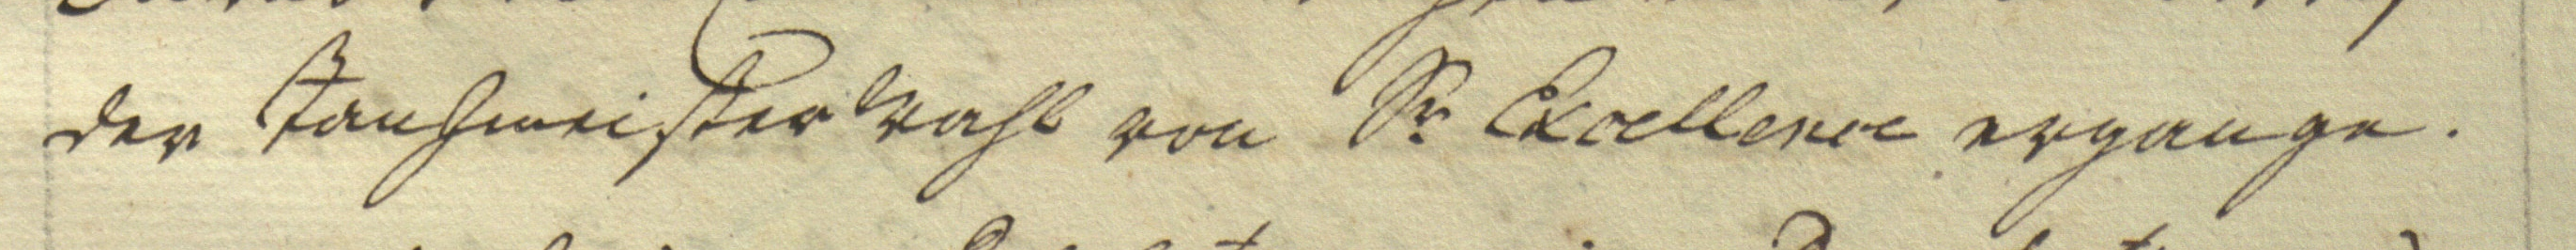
der Tanzmeister Wahl von Sr Excellence ergange¬
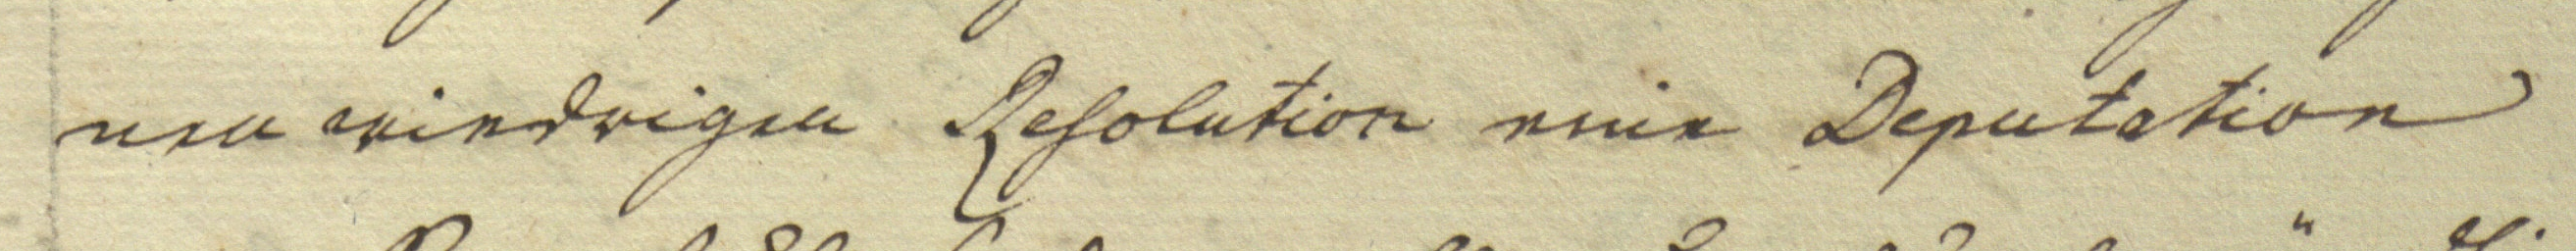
nen wiedrigen Resolution eine Deputation
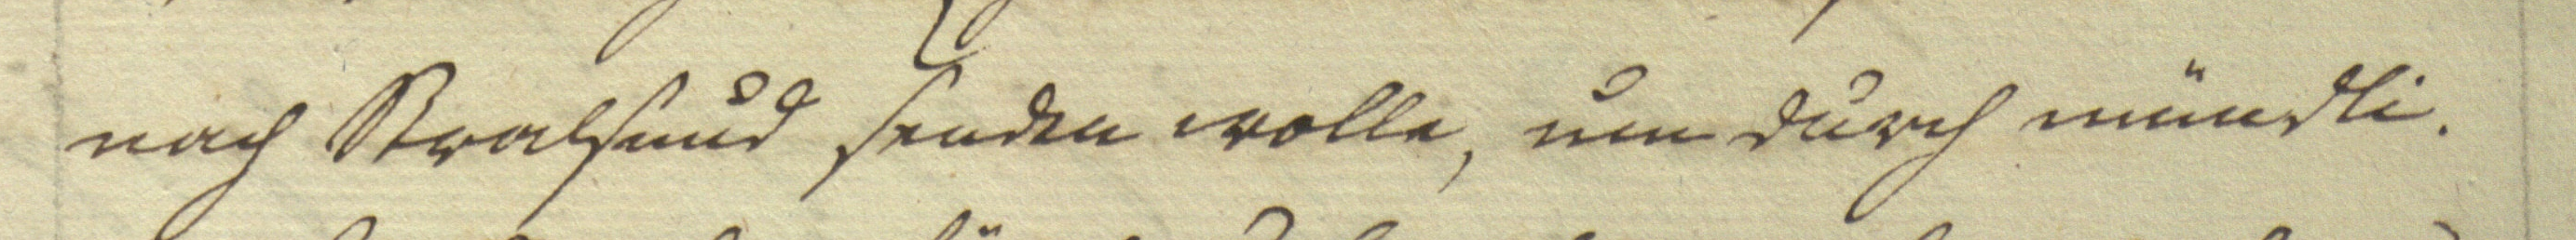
nach Stralsund senden wolle, um durch mündli¬
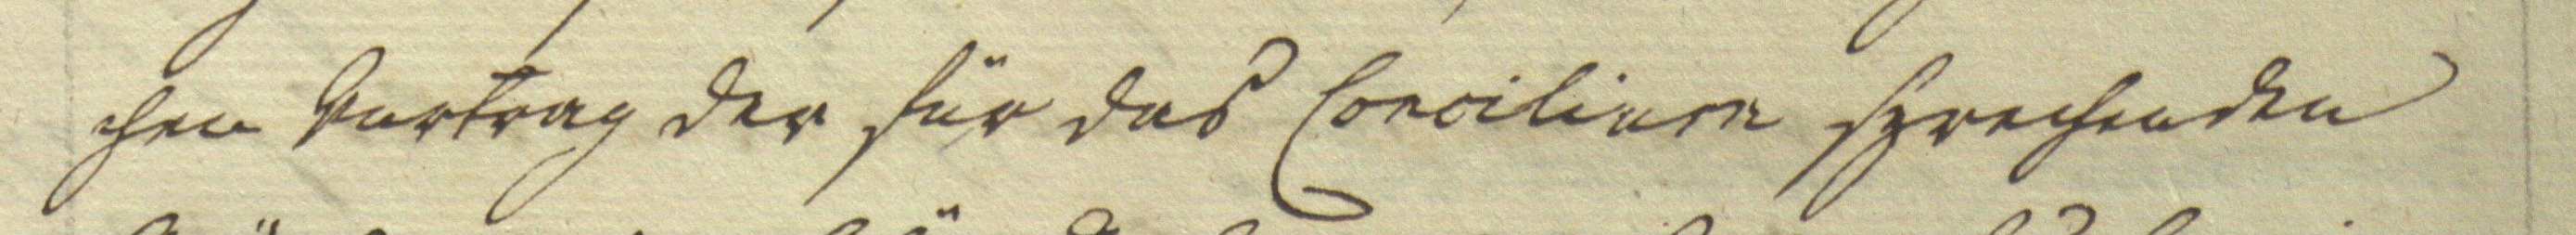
chen Vortrag der für das Concilium sprechenden
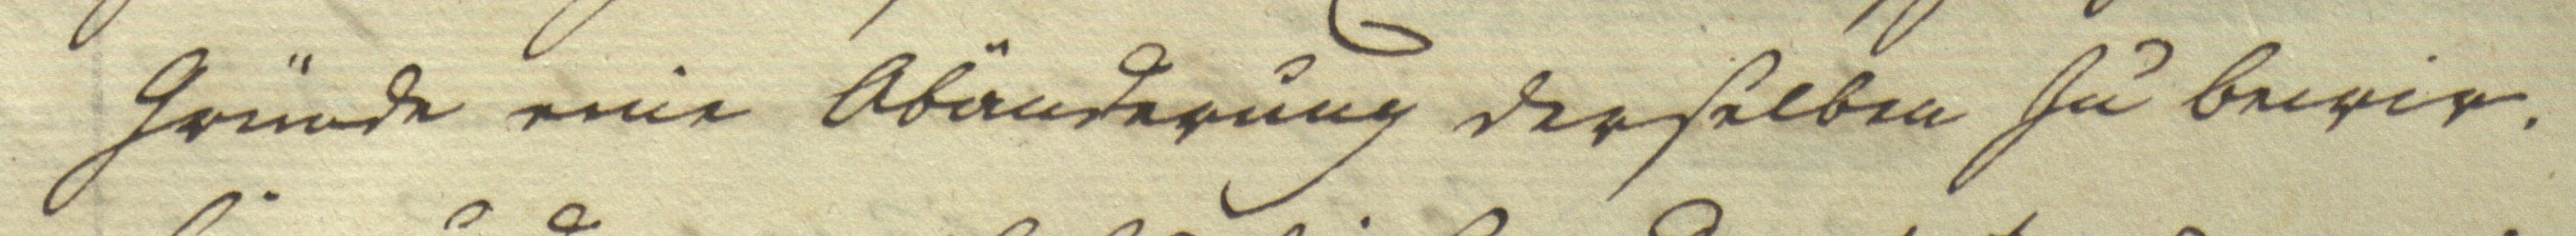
Gründe eine Abänderung derselben zu bewir¬
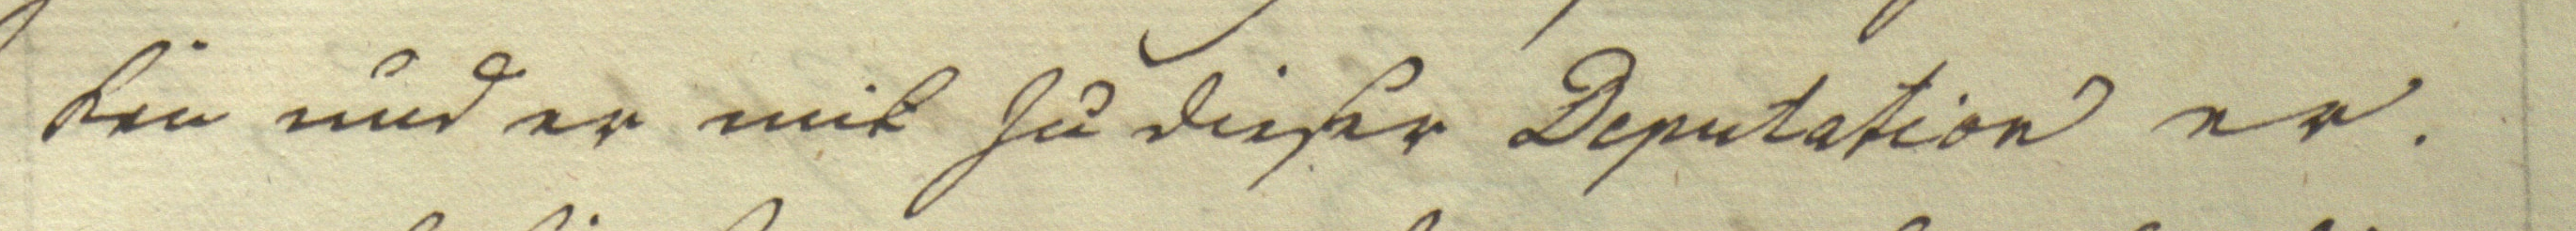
ken und er mit zu dieser Deputation er¬
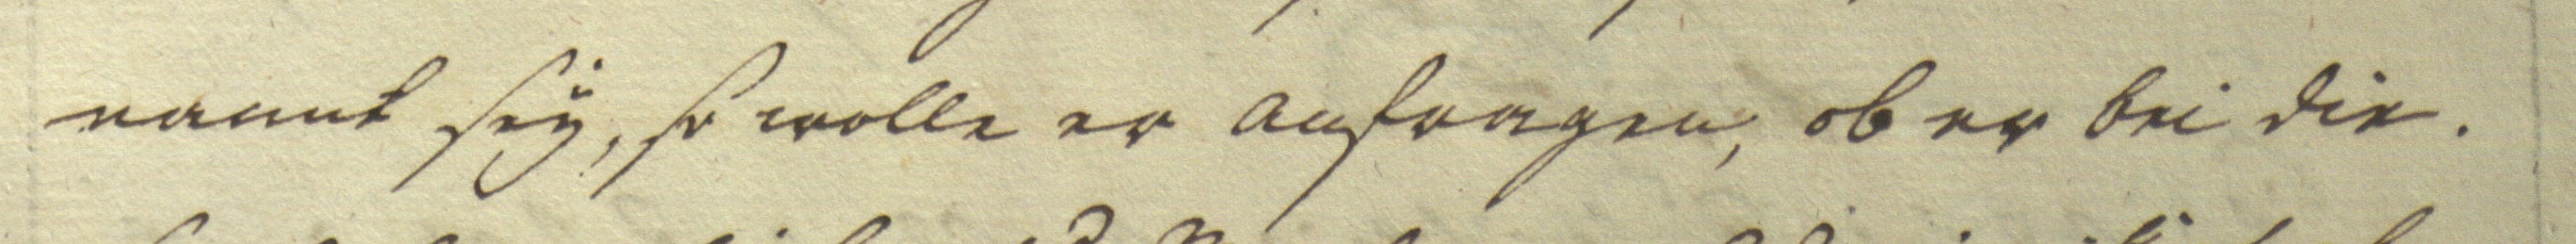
nannt seÿ, so wolle er anfragen, ob er bei die¬
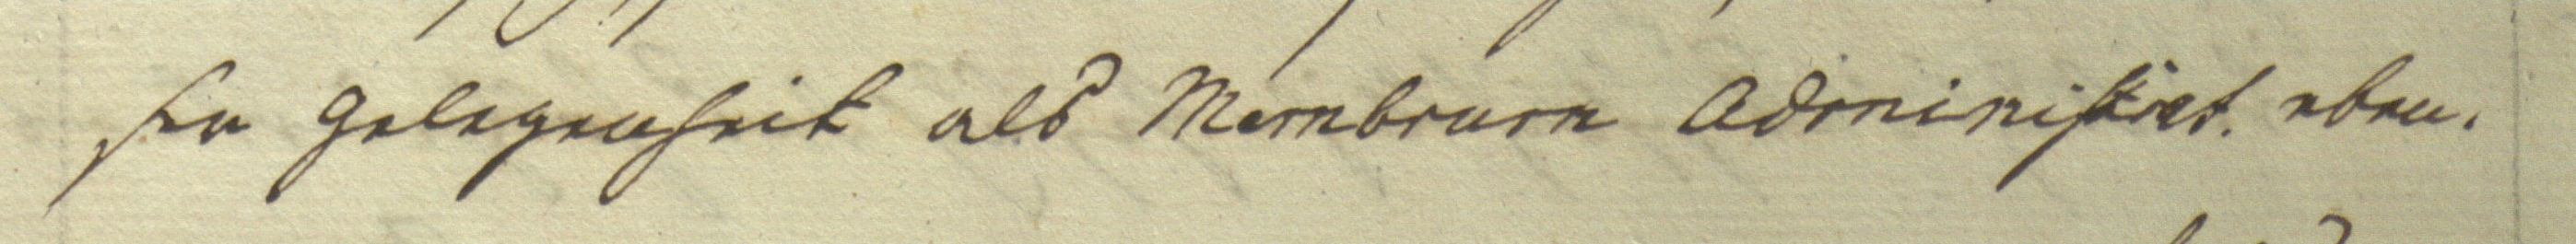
ser Gelegenheit als Membrum Administrat. eben¬
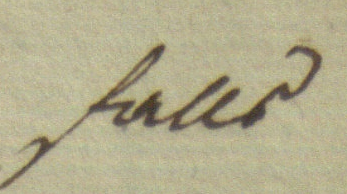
falls
